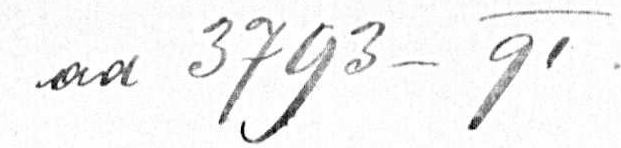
ad 3793 1891
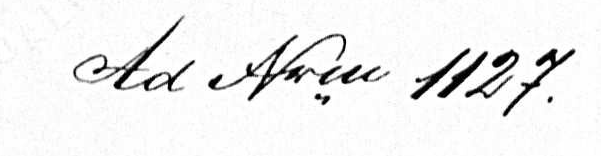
Ad Nrm 1127
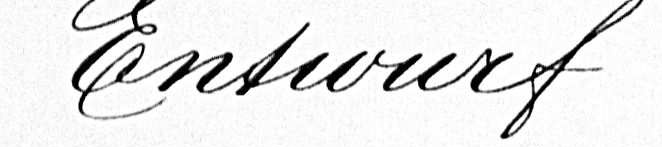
Entwurf
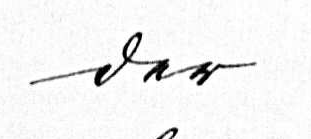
der
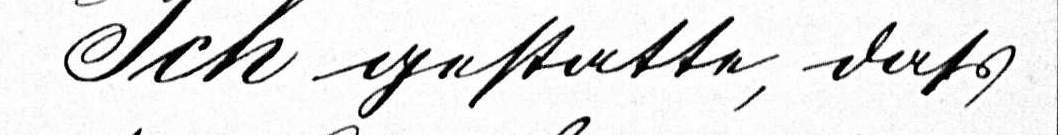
Ich gestatte, daß
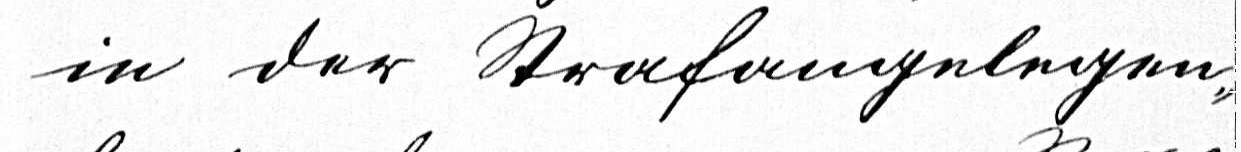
in der Strafangelegen¬
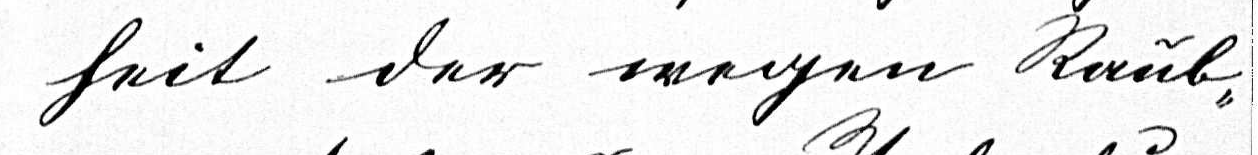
heit der wegen Raub¬
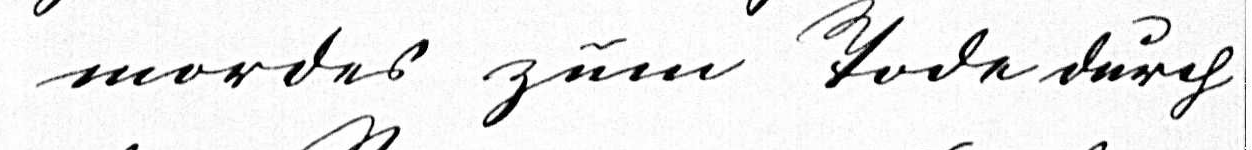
mordes zum Tode
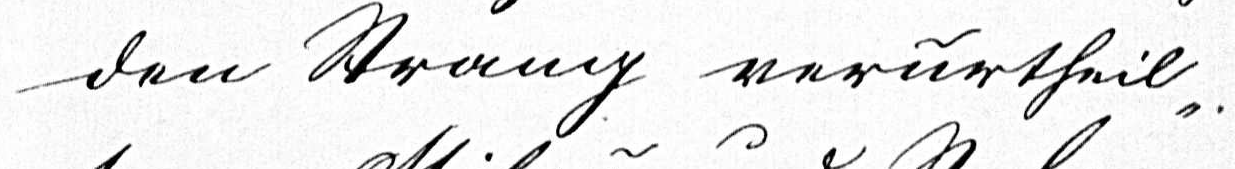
verurtheil¬
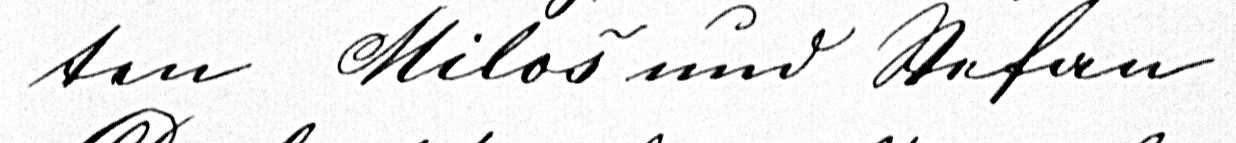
ten Miloš u. Stefan
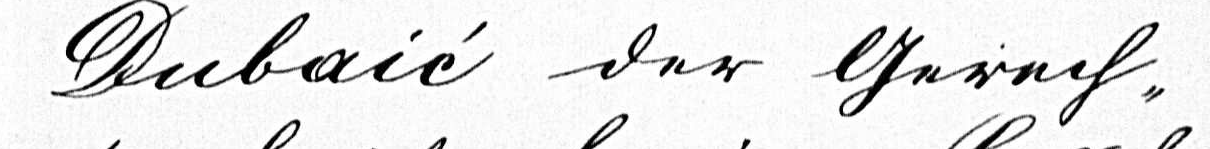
Dubaić der Gerech¬
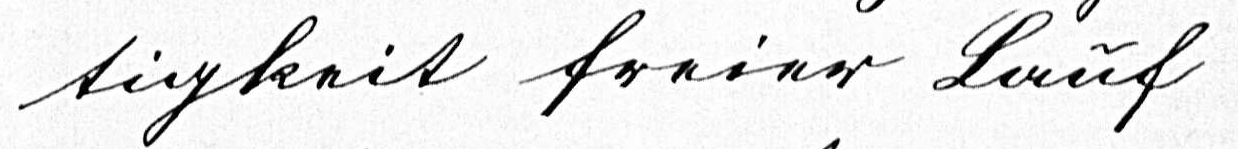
tigkeit freier Lauf
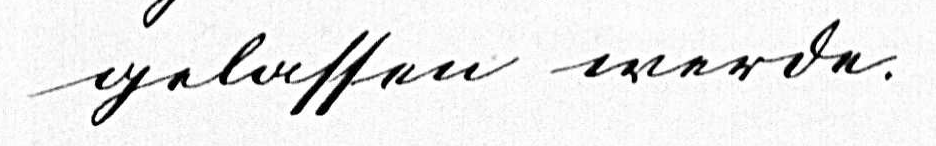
gelassen werde.
